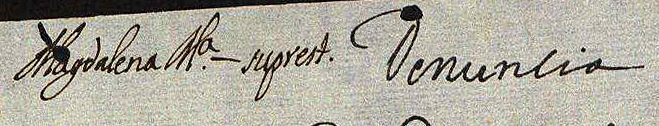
Magdalena M.a -suprest. Denuncia
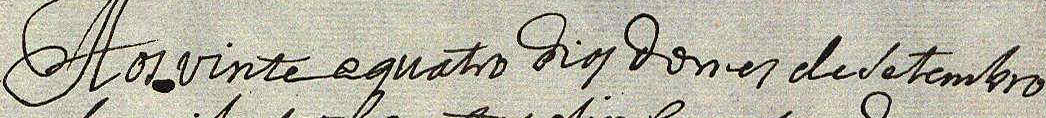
Aos vinte e quatro dias do mes de setembro
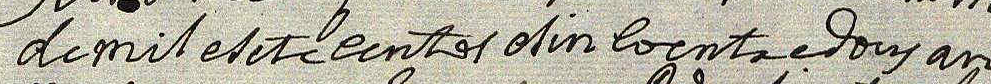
de mil e setecentos e sincoenta e dous an
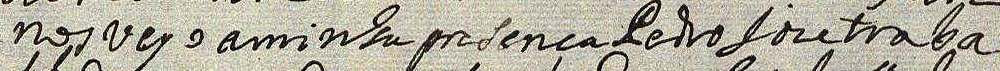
nos veyo a minha presença Pedro Joze traba
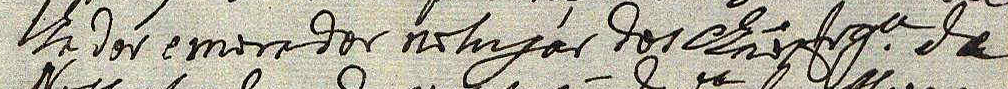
lhador e morador no lugar dos chaõs frg.a de
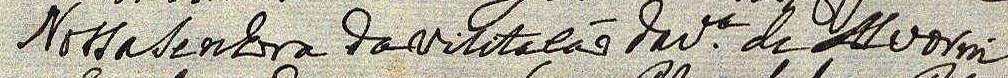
Nossa Senhora da vizitaçaõ da v.a de Alvorni
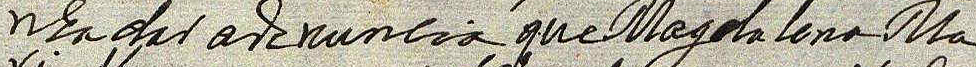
nha dar a denuncia que Magdalena Ma
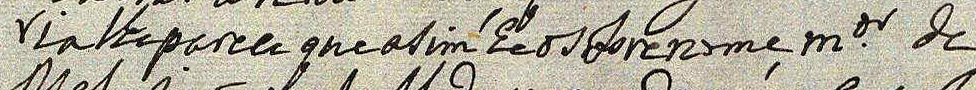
ria lhe parece que asim he o sobrenome, m.er de
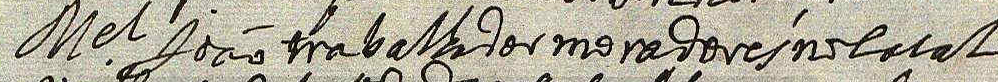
M.el João trabalhador moradores no cazal
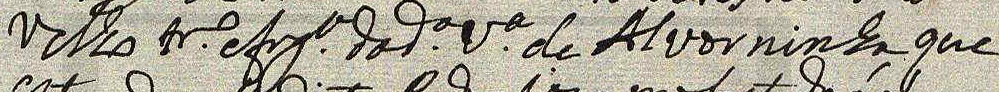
velho tr.o e frg.a da d.a V.a de Alvorninha, que
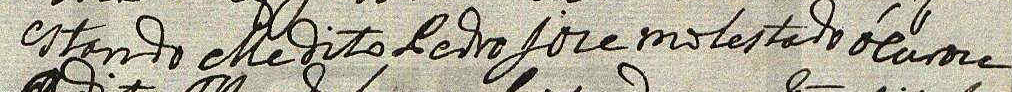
estando elle dito Pedro Joze molestado o curou
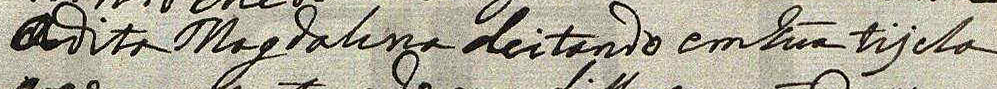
a dita Magdalena deitando em hūa tijela
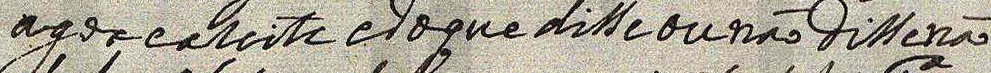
agoa e azeite e do que disse ou naõ disse naõ
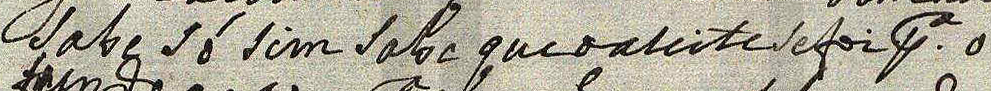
Sabe só sim sabe que o azeite se foi p.a o
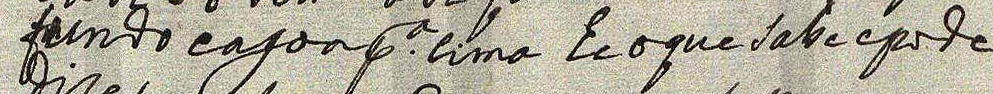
fundo e agoa p.a cima he o que sabe e pode
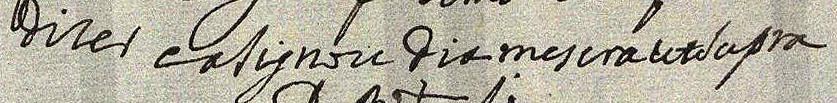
dizer e asignou dia mes era ut supra
